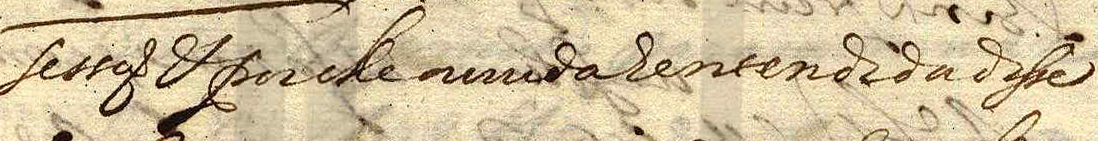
sessaõ & por elle ouuida E entendida disse
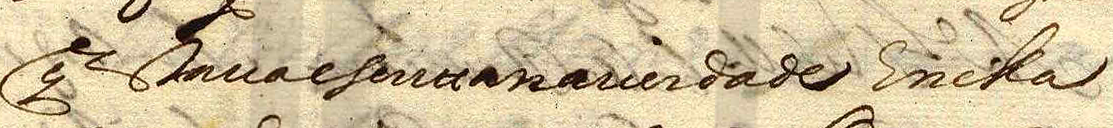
q̄ estaua escritta na uerdade E nella
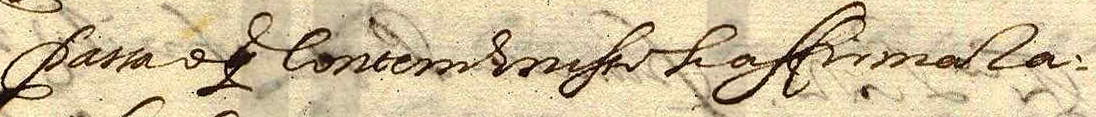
passa o q̄ contem E nisso se affirma Ra
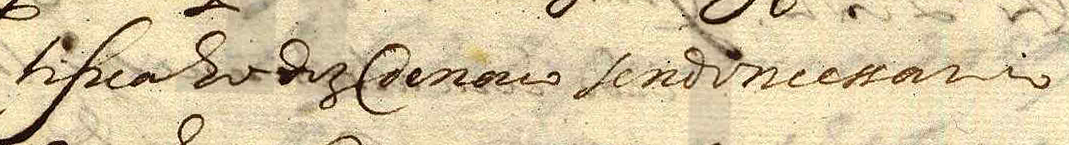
tifica E o diz de nouo sendo necessario
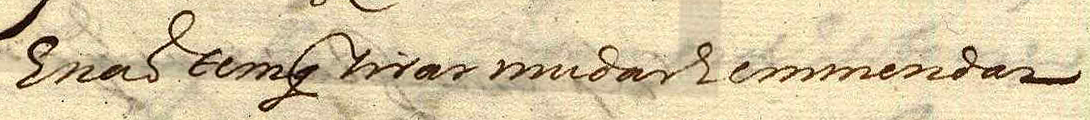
E naõ tem q̄ tirar mudar E emmendar
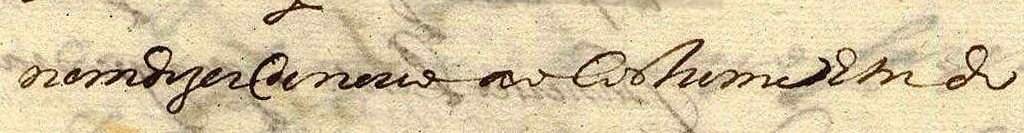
nem dizer de nouo ao costume E tudo
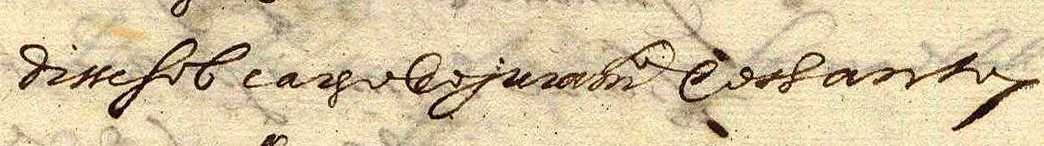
disse sob cargo do juramto dos santos
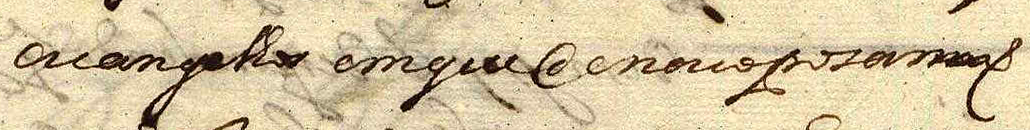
euangelhos em que de nouo pos a maõ
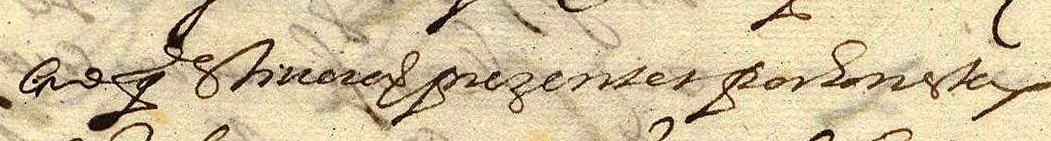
ao q̄ estiueraõ prezentes por honestas
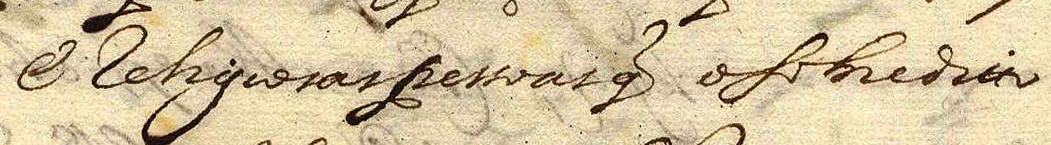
e Religiozas pessoas q̄ o sobreditto
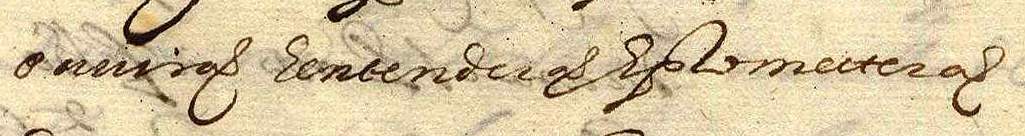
ouuiraõ E entenderaõ E prometteraõ
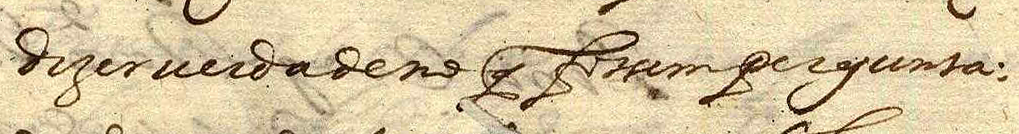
dizer uerdade no q̄ fossem pergunta
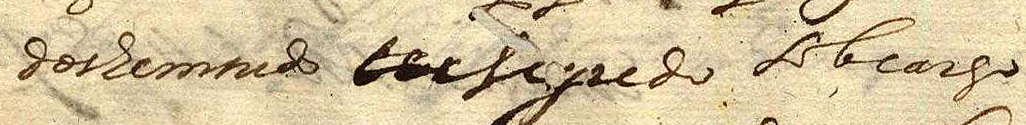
dos E em tudo ter segredo sob cargo
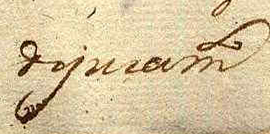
do juramto
